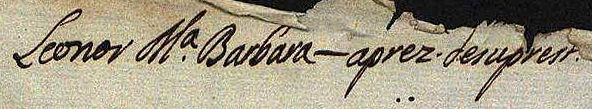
Leonor M.a Barbara = aprez. de suprest.
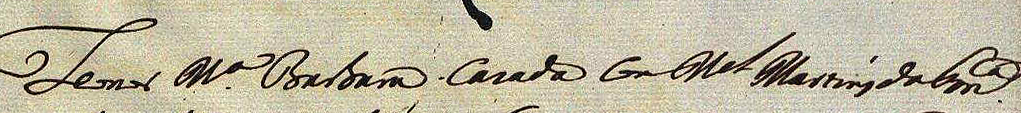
Leonor M.a Barbara cazada com M.el Martins da Com.ca
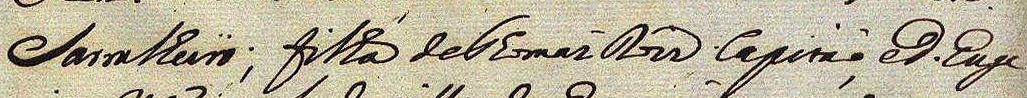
Sarralheiro; filha de Thomaz Roiz Capitaõ, e D. Euge
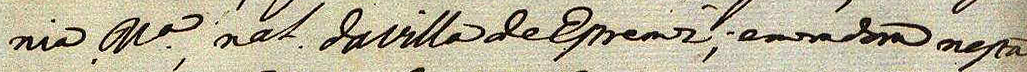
nia M.a, nal. da villa de Estremoz; e moradora nesta
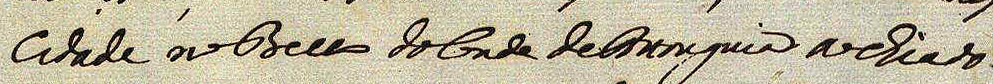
Cidade no Becco do Conde de Atouguia ao chiado
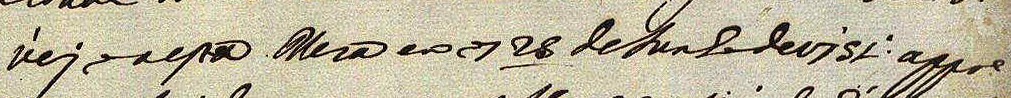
vejo a esta Meza, em os 28 de Iunho de 1751. appre
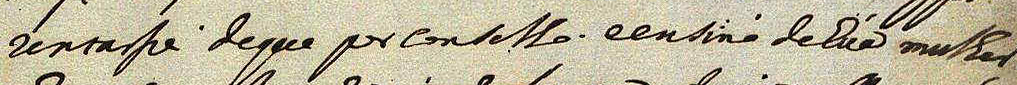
zentarsse de que por conselho. e ensino de hūa mulher
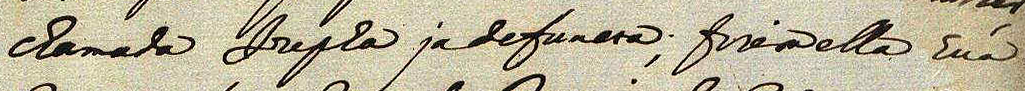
chamada Jozepha ja defuncta; fizera ella huā
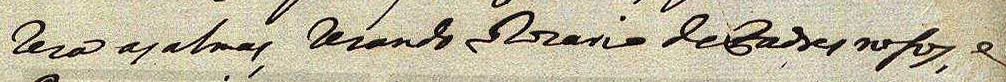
Reza as almas, Rezando Rozario de Padres nosos, e
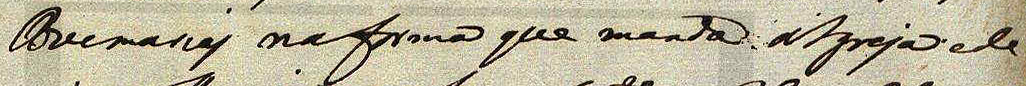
Ave marias na forma que manda: a Igreja e de
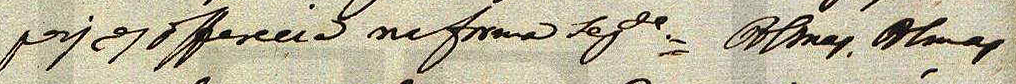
pois os offerecia na forma seg.te= Almas, Almas
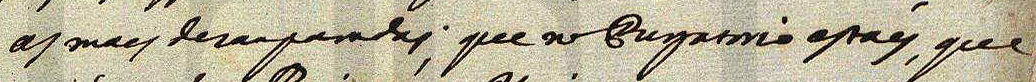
as maes dezanparadas; que no Purgatorio estaés, que
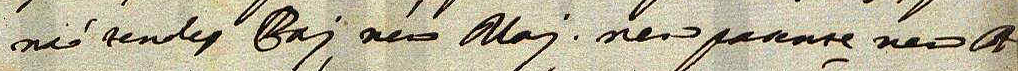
naõ tendes Paj, nen Maj. nem parente nem A
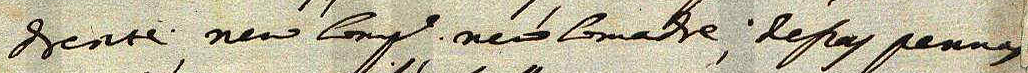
drente; nem Comp.a; nem Comadre dessas pennas
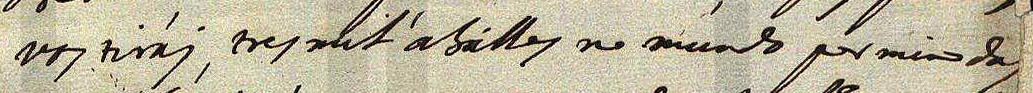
vos tiraj, tres mil abállos no mundo por mim daj
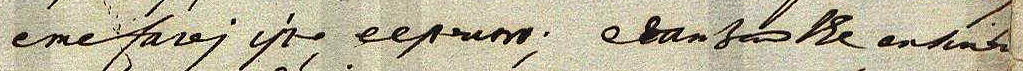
e me fazej isto, e es outro; e tambem lhe ensin
